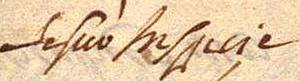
sesaõ In speçie
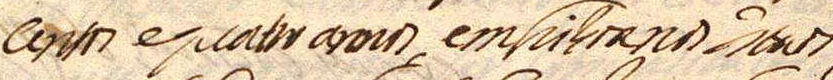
centos e quatro annos em lisboa nos Estaos
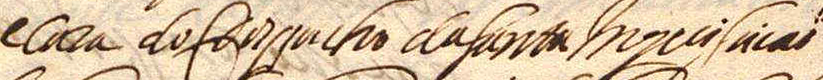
e caza do Despacho da santa Inquisicaõ
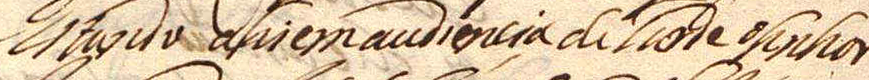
Estando ahi em audiençia de tarde o senhor
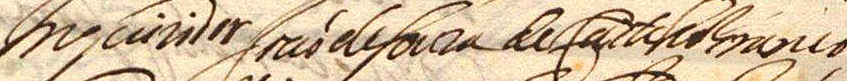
Jnquizidor Joaõ de souza de Castelo branco
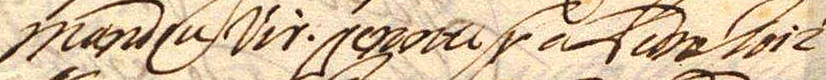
mandou vir. perante sy a Pedro Roiz̄
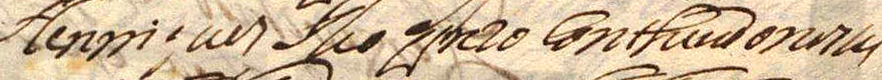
Henriques Reo prezo Contheudo nestes
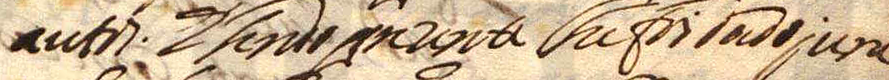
autos. E sendo prezente lhe foi dado jura
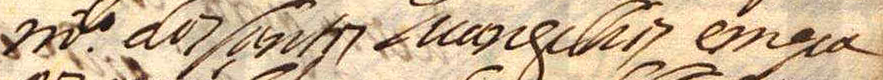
m.to dos santos Euangelhos em que
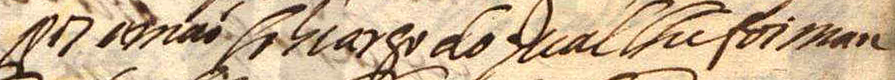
pos a maõ sob cargo do qual lhe foi man
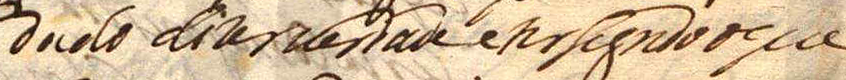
dado dizer uerdade e ter segredo de que
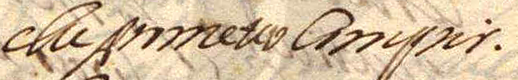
elle prometeo comprir.
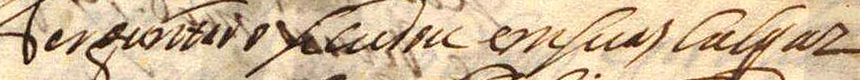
Perguntado se cudou em suas Culpaz
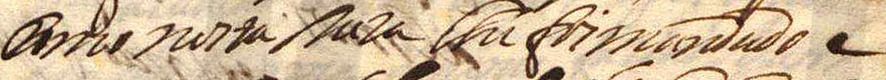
como nesta Meza lhe foi mandado e
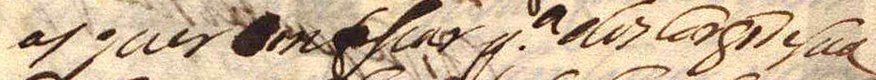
as quer confessar p.a descargo de sua
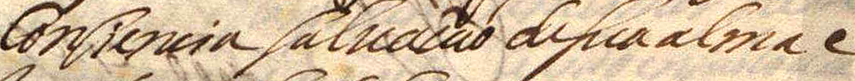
ConCiencia saluacaõ de sua alma e
